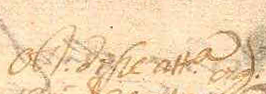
o R. disse a tta. o q̄
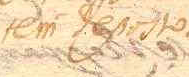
tem deposto
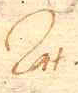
Rat.
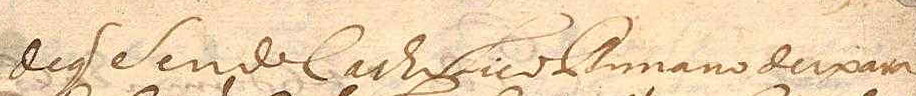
de q̄ Sendo Catholico Romano deixava
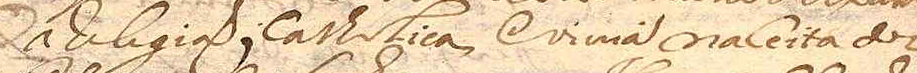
a Religiaõ Catholica, e viuia na Ceita dos
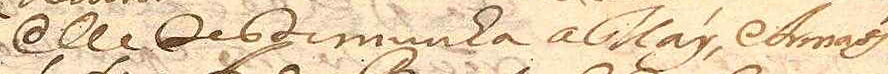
elle testemunha a May, e Irmaõs
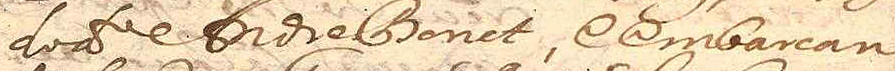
do d̄o Andre Bonet, e embarcan
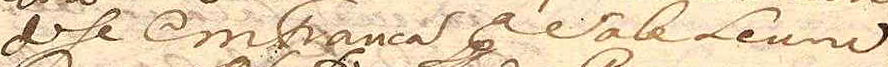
dose em França pa sale leuou
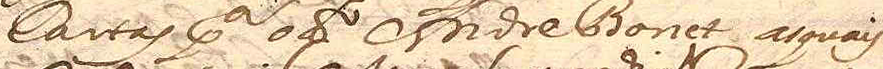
Cartas pa o d̄o Andre Bonet as quais
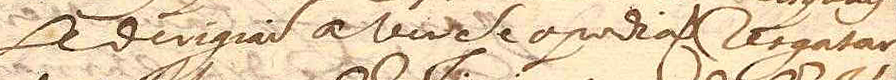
se derigiaõ a ver se o podiaõ Resgatar
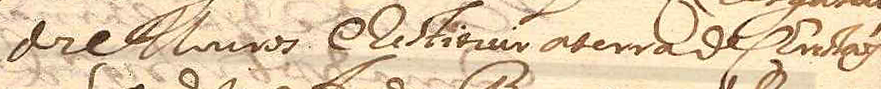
dos Mouros e Restituir a terra de Christaõs
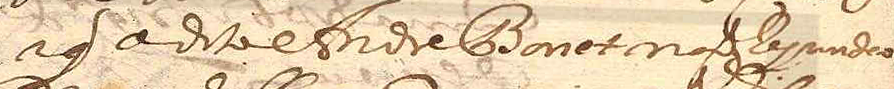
a q̄ o dito Andre Bonet naõ Respondeo
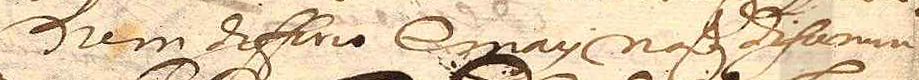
nem differio E mais naõ disse nem
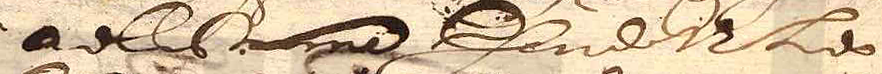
ao Costume E sendolhe Lido
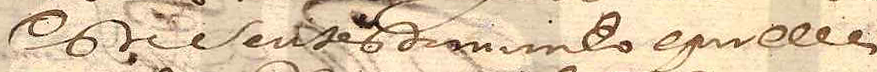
este seu testemunho e por elle
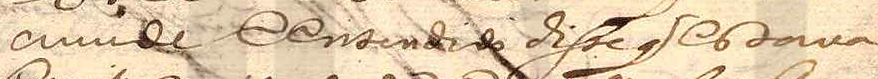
ouuido E entendido disse q̄ estaua
